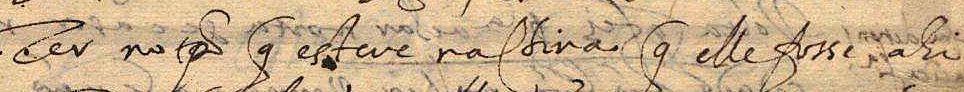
Zer no tpō q̄ esteve na China q̄ elle fosse ahi
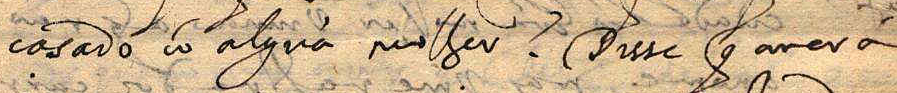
casado cō alguā molher? Disse q̄ averá
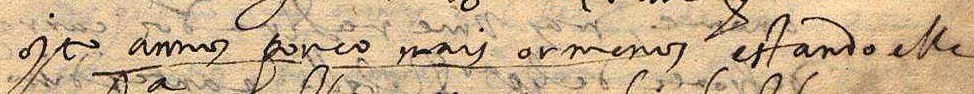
ojto annos pouco mais ou menos estando elle
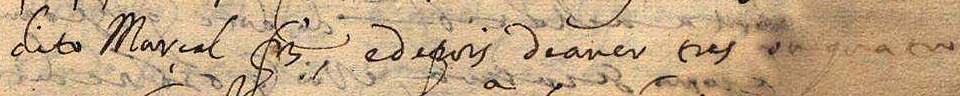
dito Marçal frz̄, e depois de auer tres ou quatro
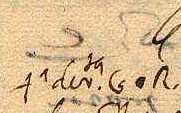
ta de v.ta q̄ o R.
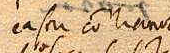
casou cō lianor
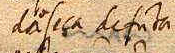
daoseca defūta.
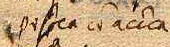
postea cō acēca
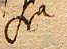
fra
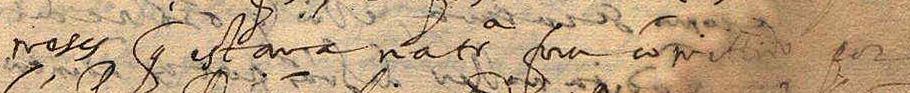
meses q̄ estava na tra fora cōmittido por
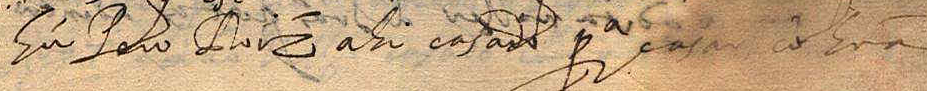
hū Pero Roiz̄ ahi casado ꝑa casar cō huā
